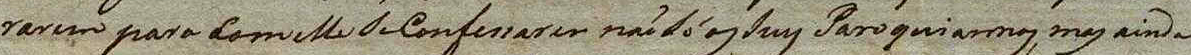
rarem para com elle Se Confessarem naõ só os seus Paroquianos, mas ainda
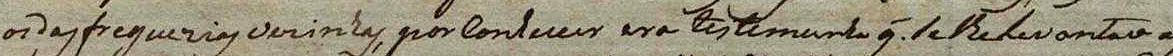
os da freguezia vezinhas, por conhecer era testemunha q̄ se lhe levantava,
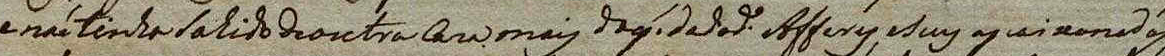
e naõ tinha sahido de outra caza mais do q̄ do d.o Alferes, e seus apaixonados,
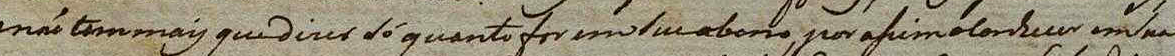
e naõ tem mais que dizer só quanto for em seu abono, por assim o conhecer em sua
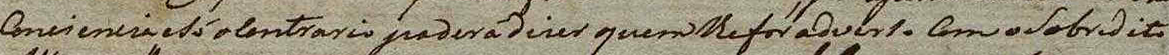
consciencia e só o contrario poderá dizer quem lhe for adverso Com o sobredito
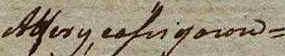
Alferes, e assignou =
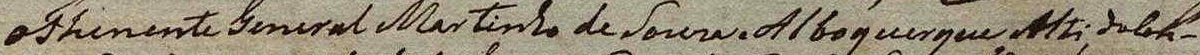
O Thenente General Martinho de Souza Alboquerque Alti, do Con
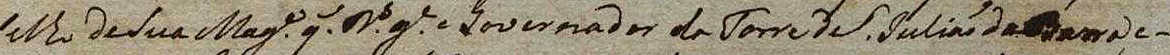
selho de Sua Mag.e q̄ D.s g.e Governador da Torre de S. Iuliaõ da Barra, e
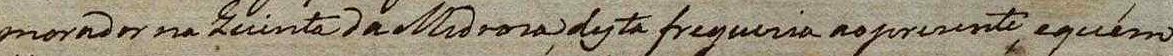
morador na Quinta da Midroza, desta freguezia ao prezente, e quem
